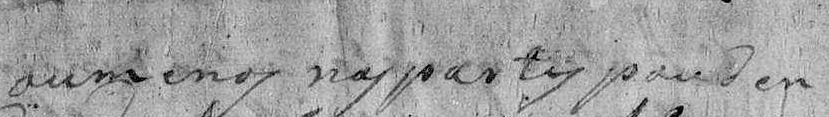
ou menos nas partes pouden
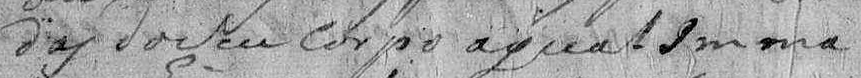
das do seu corpo a qual Imma
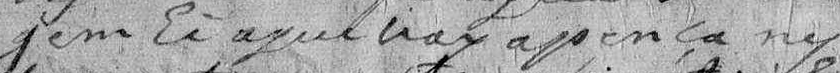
gem hé a que vay apença nes
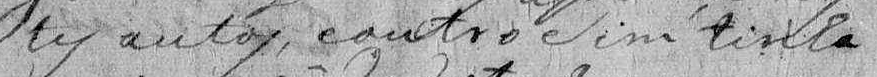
tes autos, e outrosim tinha
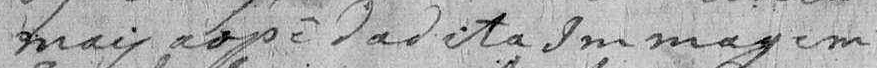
mais ao pé da dita Immagem
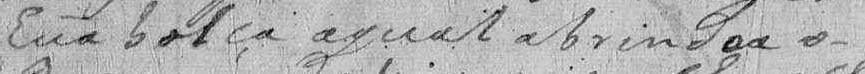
huã bolça a qual abrindoa o
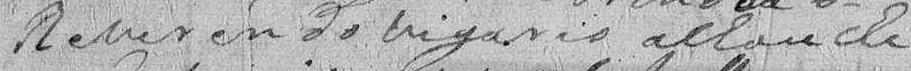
Reverendo vigario achou che
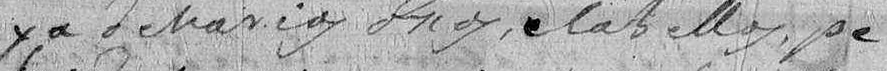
ya de varios ossos, e Cabellos, pe
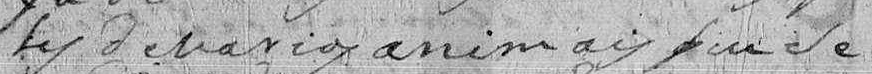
les de varios animais que se
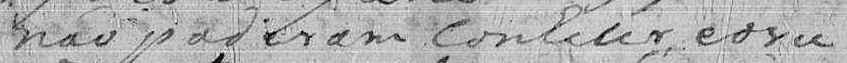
naõ poderam conhecer, e o viu
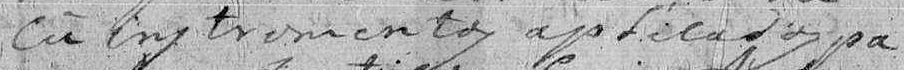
Cū instromentos aplicados pa
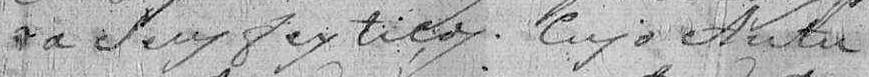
ra seus feytiços. Cujo Autu
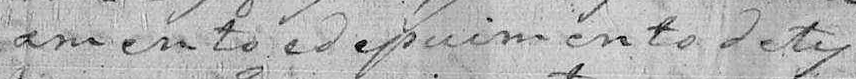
amento e depuimento de tes
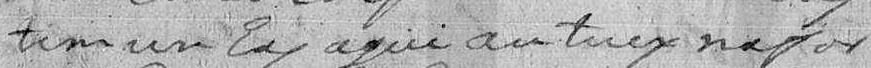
temunhas aqui autuey na for
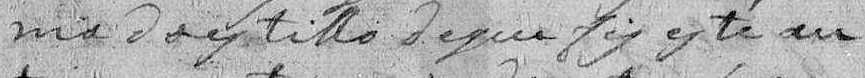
ma do estillo de que fis este au
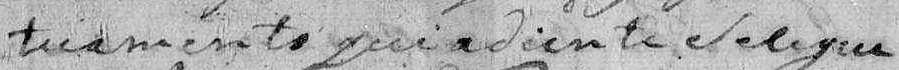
tuamento que adiante se cegue
